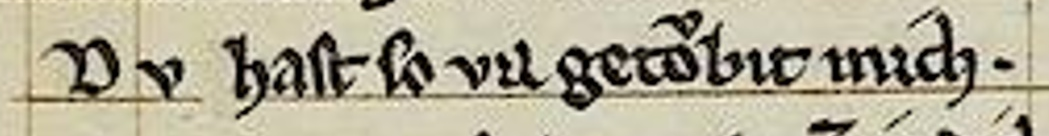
Dv haſt ſo vil geto°vbit mich.
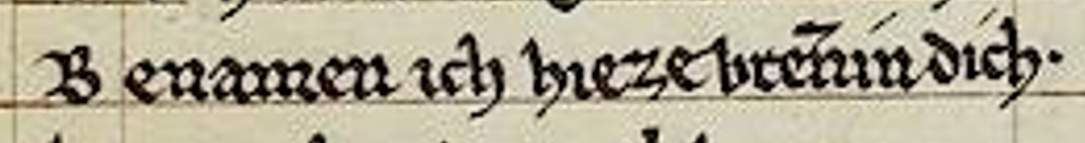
Benamen ich hieze bren(n)in dich.
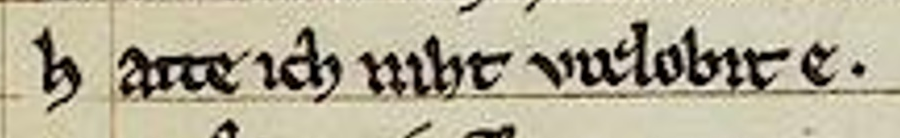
Hatte ich niht virlobit e.
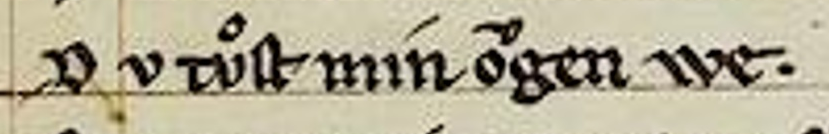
Dv tv°oſt min o°vgen we.
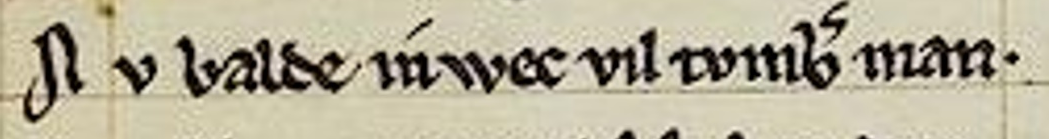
Nv balde in wec vil tvmb(er) man.
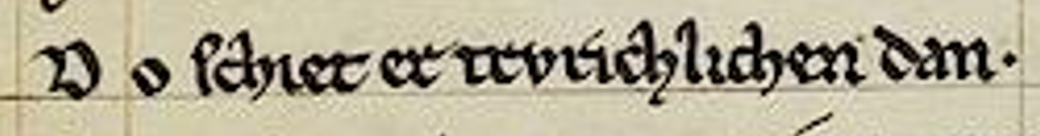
Do ſchiet er trvrichlichen dan.
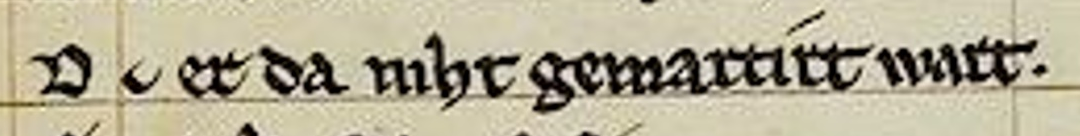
D(az) er da niht gemartirt wart.
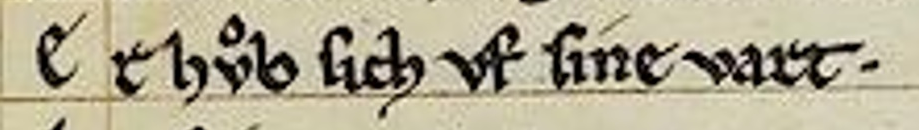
Er hv°ob ſich vf ſine vart.
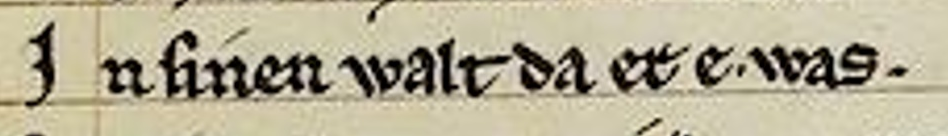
In ſinen walt da er e was.
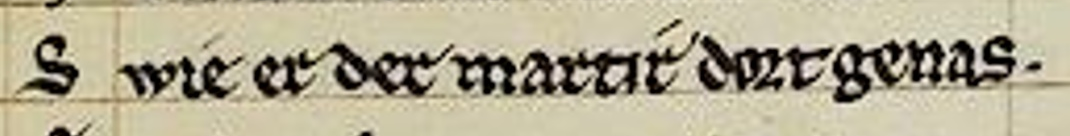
Swie er der martir dort genas.
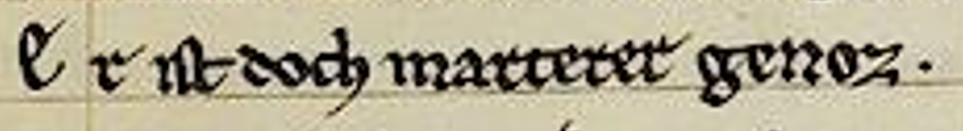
Er iſt doch marterer genoz.
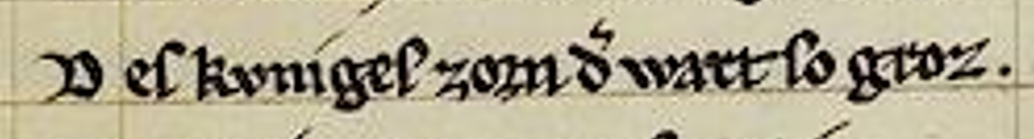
Deſ kvnigeſ zorn d(er) wart ſo groz.
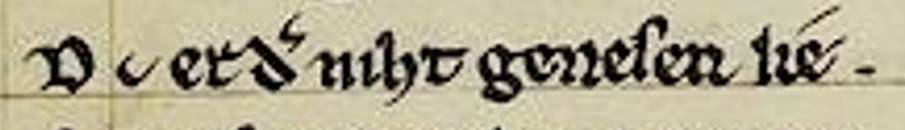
D(az) er d(er) niht geneſen lie.
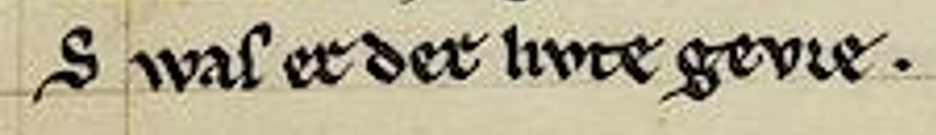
Swaſ er der livte gevie.
